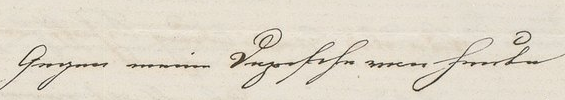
Gegen meine Depesche von heute
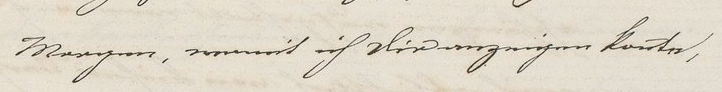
Morgen, womit ich Dir anzeigen konnte,
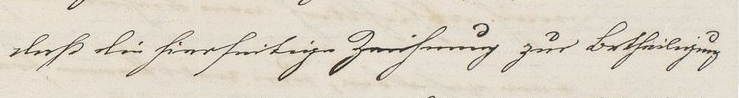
daß die hierseitige Zeichnung zur Betheiligung
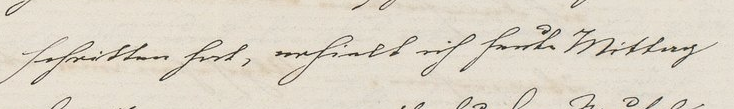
schritten hat, erhielt ich heute Mittag
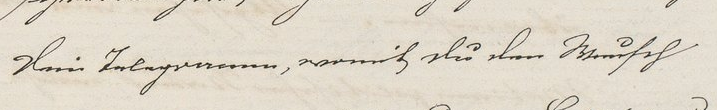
Dein Telegramm, womit Du den Wunsch
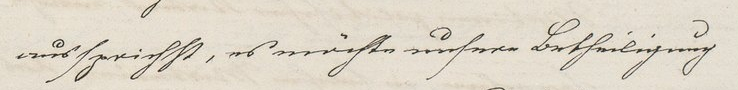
aussprichst, es möchte unsere Betheiligung
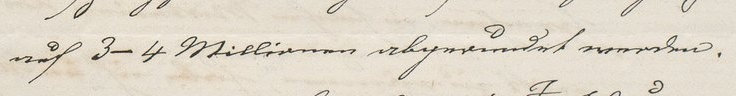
auf 3–4 Millionen abgerundet werden.
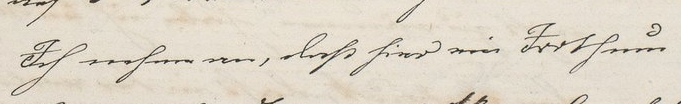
Ich nehme an, daß hier ein Irrthum
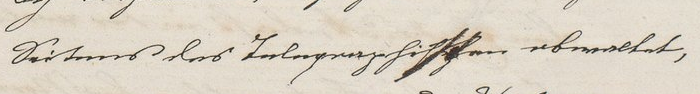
Seitens des Telepgraphisten obwaltet,
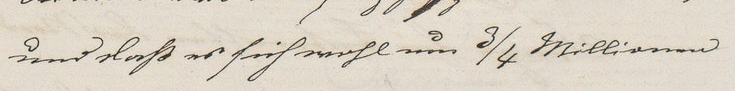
und daß es sich wohl um ¾ Millionen
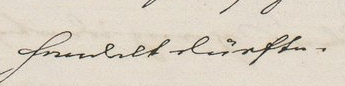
handelt dürfte.
